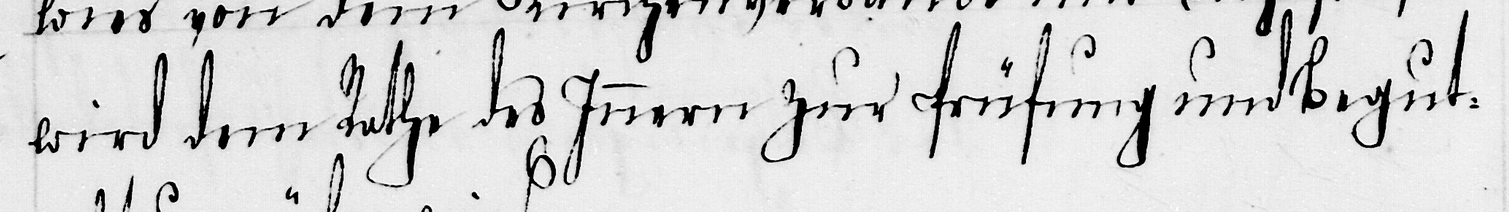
wird dem Rathe des Innern zur Prüfung und Begut¬
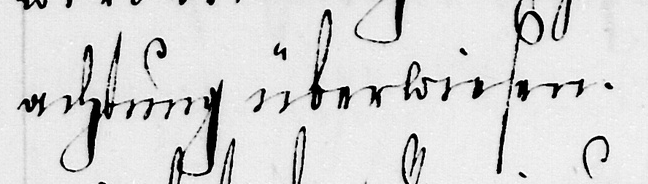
achtung überwiesen.
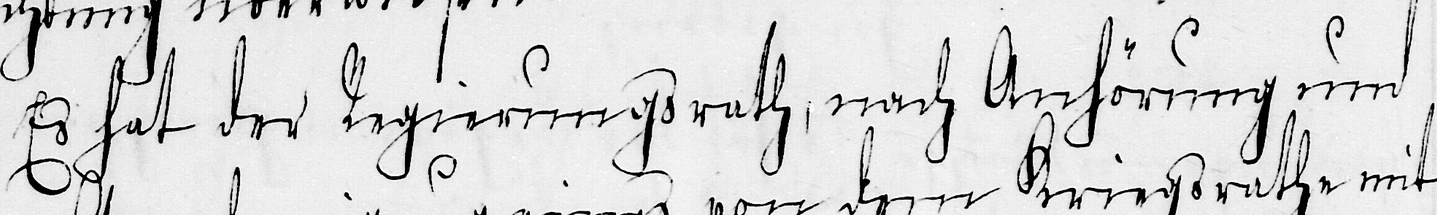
Es hat der Regierungsrath, nach Anhörung und
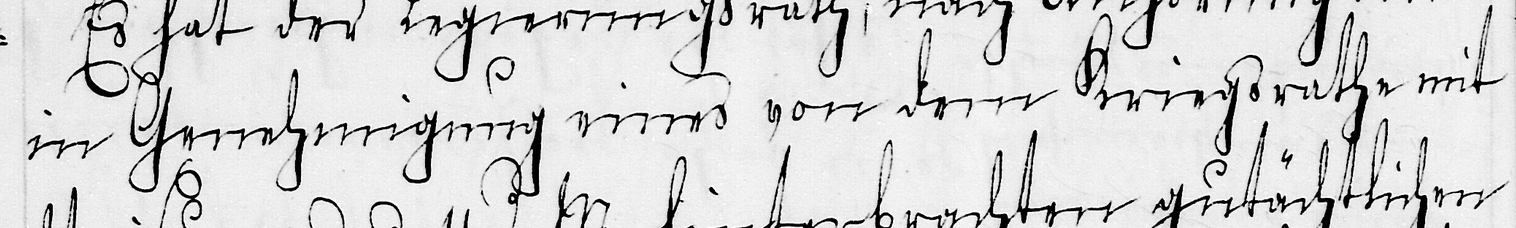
in Genehmigung eines von dem Kriegsrathe mit
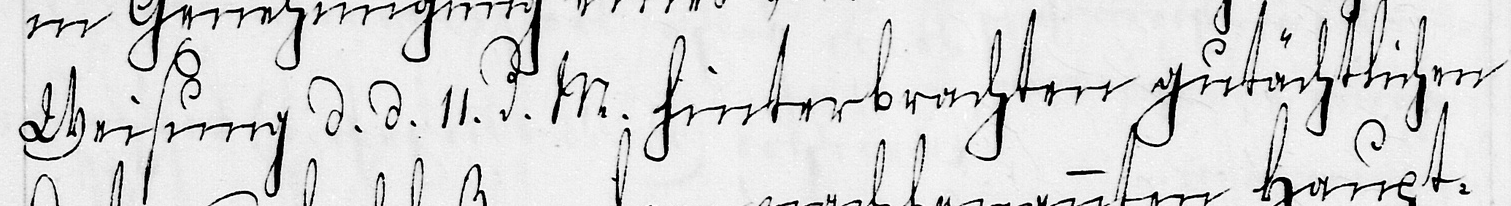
Weisung d. d. 11. d. M. hinterbrachten gutächtlichen
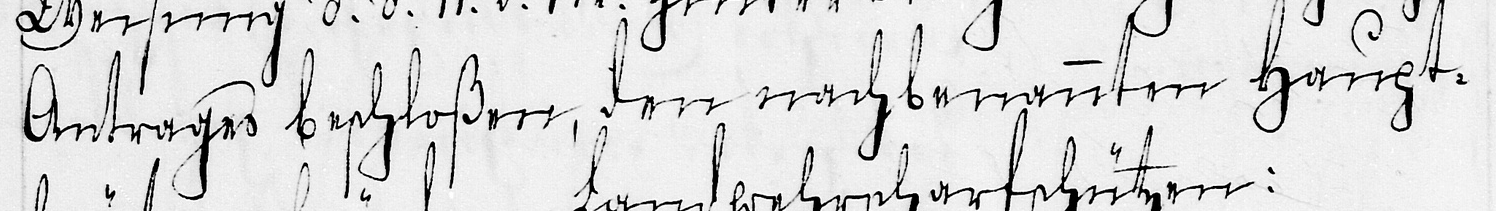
Antrages beschloßen, den nachbenannten Haupt¬
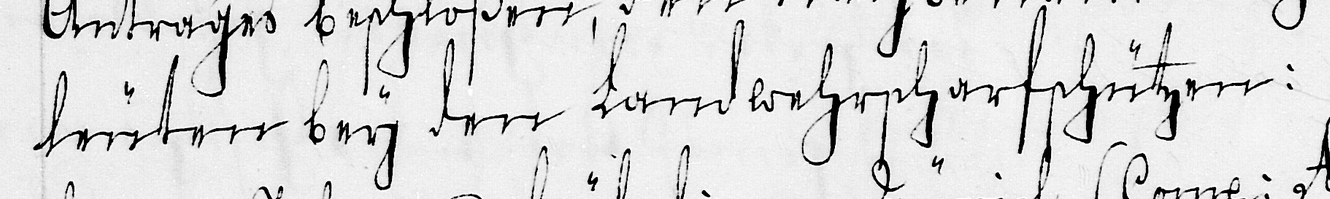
leuten bey den Landwehrscharfschützen:
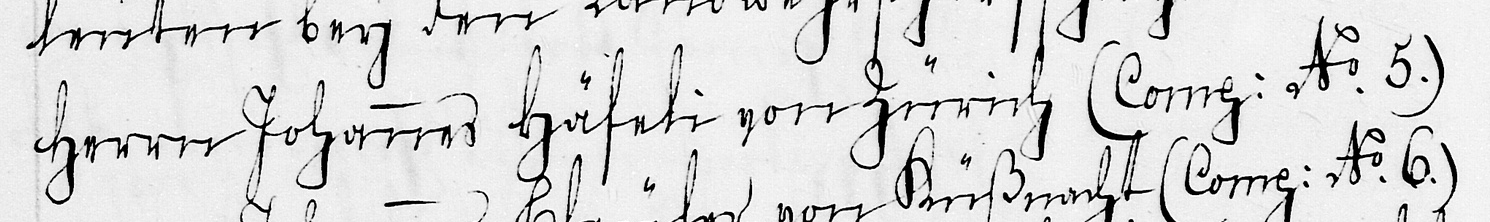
Herrn Johannes Häfeli von Zürich (Comp: N°. 5.)
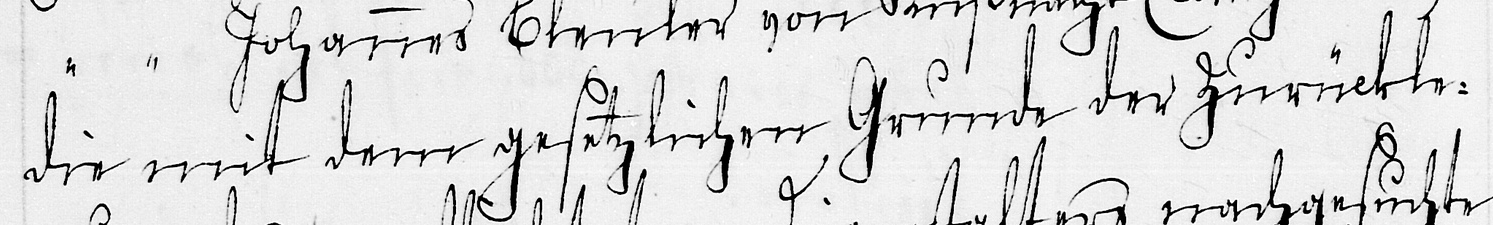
die mit dem gesetzlichen Grunde der Zurückle¬
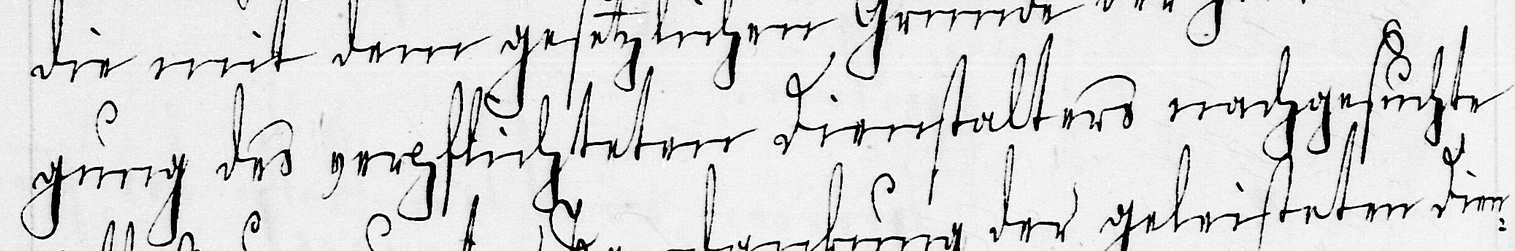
gung des verpflichteten Dienstalter nachgesuchte
